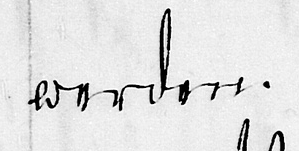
werden.
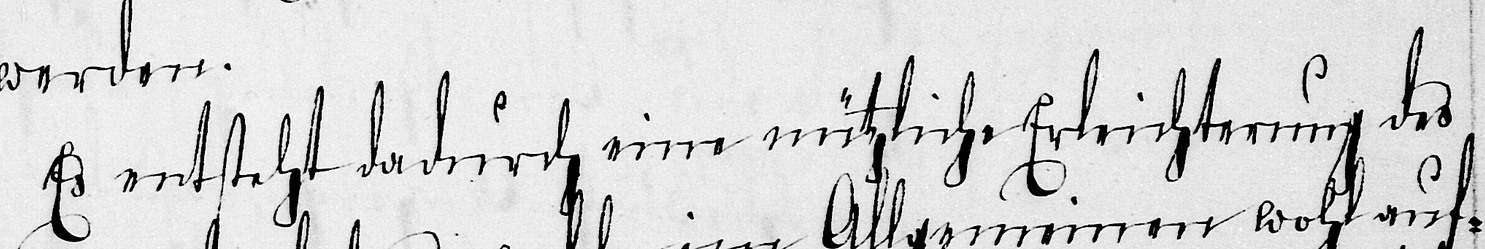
Es entsteht dadurch eine nützliche Erleichterung des
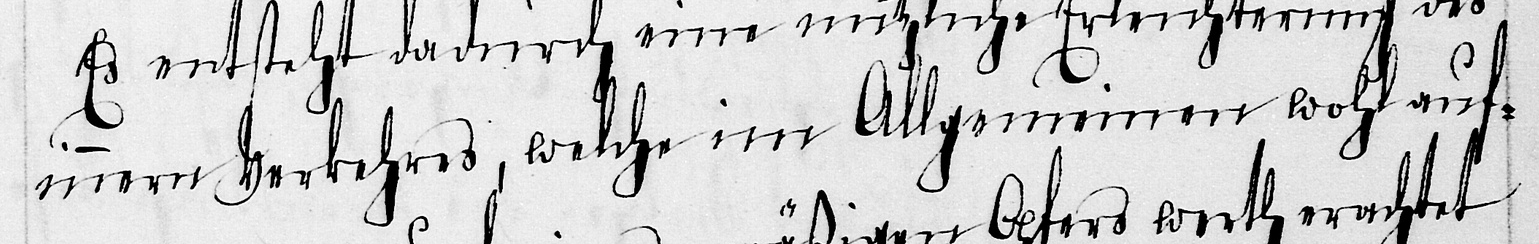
innern Verkehres, welche im Allgemeinen wohl auf¬
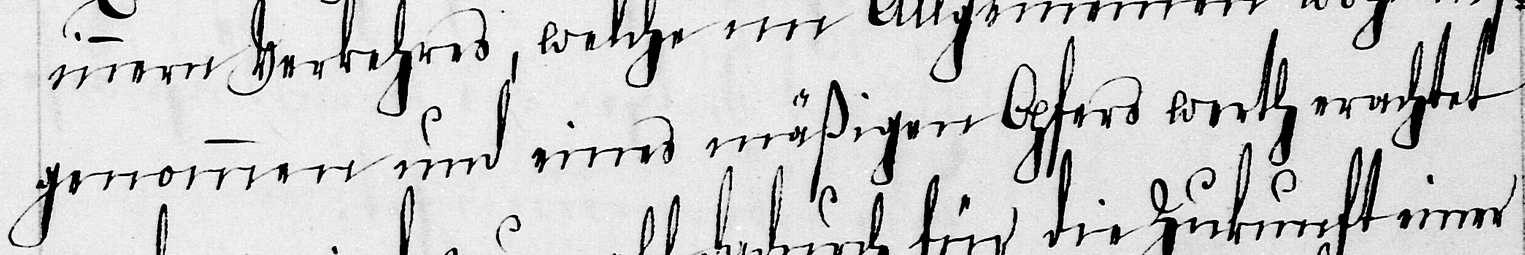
genommen und eines mäßigen Opfers werth erachtet
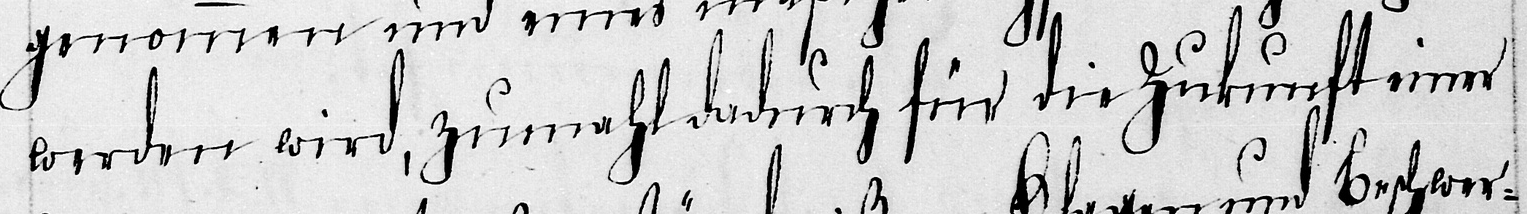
werden wird, zumahl dadurch für die Zukunft einer
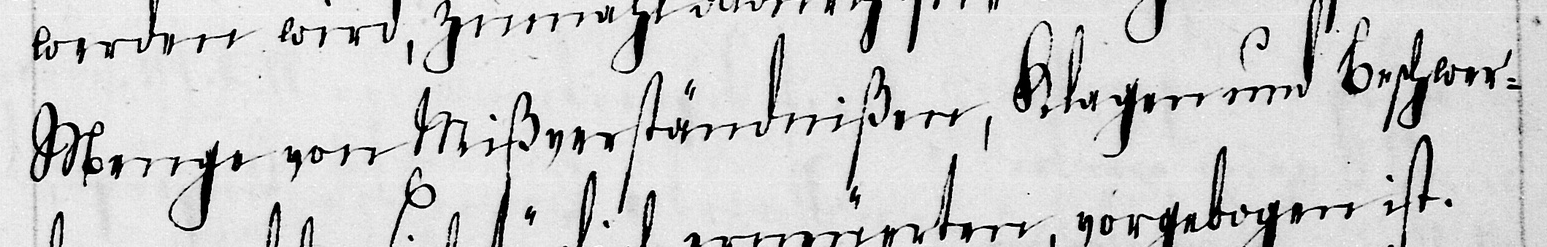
Menge von Mißverständnißen, Klagen und Beschwer¬
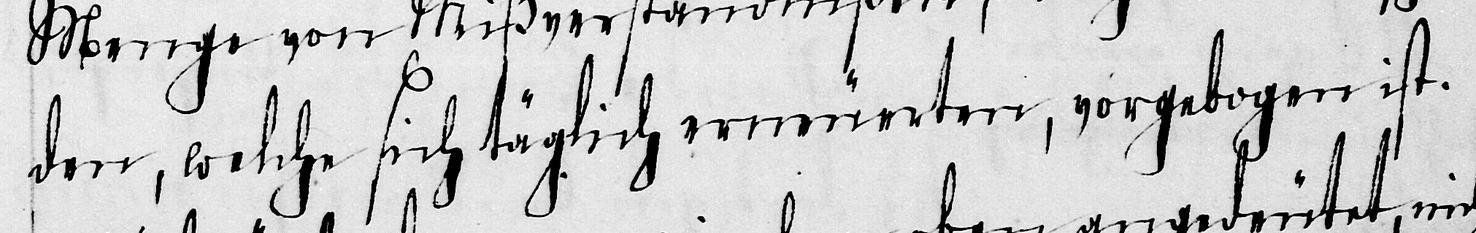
den, welche sich täglich erneuerten, vorgebogen ist.
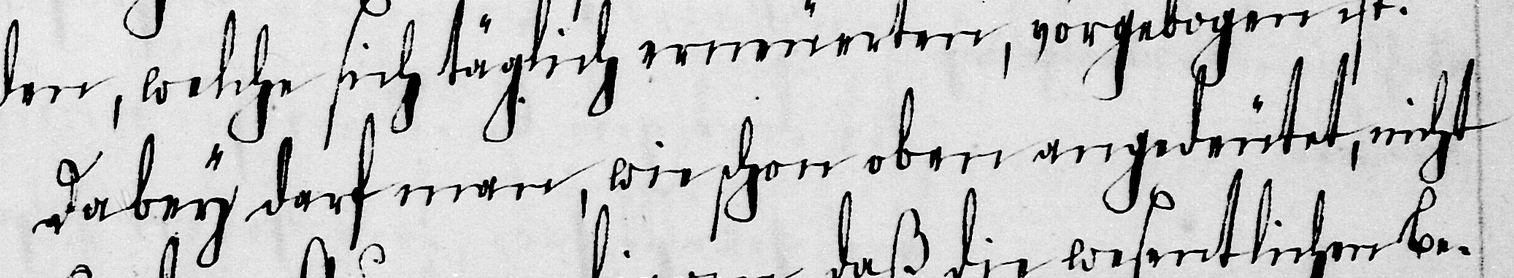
Dabey darf man, wie schon oben angedeutet, nicht
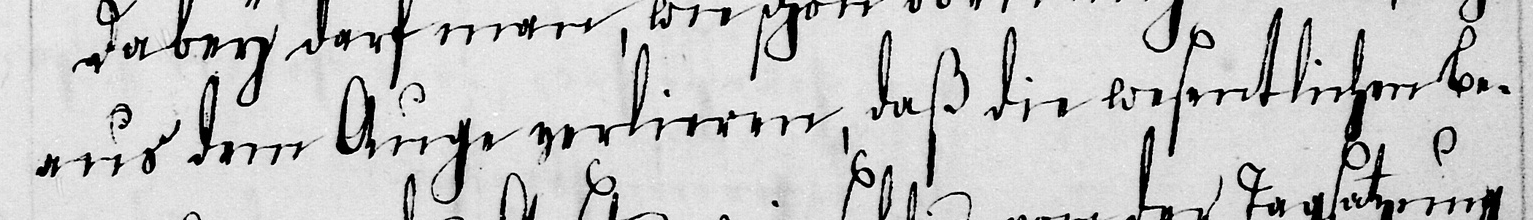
aus dem Auge verlieren, daß die wesentlichen Be¬
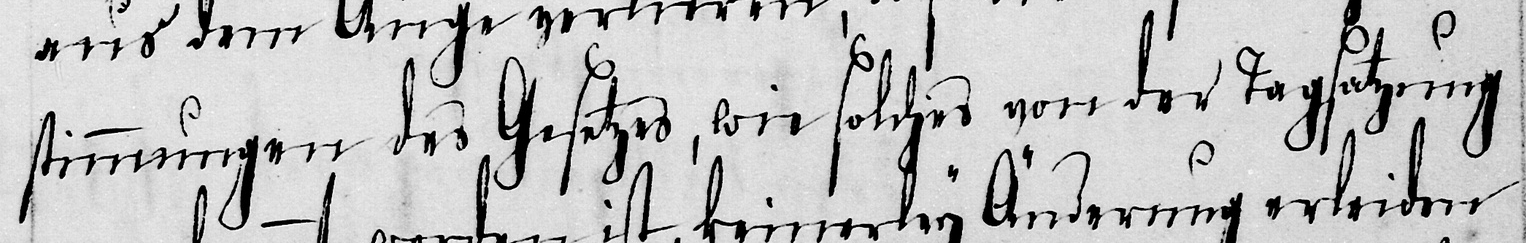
stimmungen des Gesetzes, wie solches von der Tagsatzung
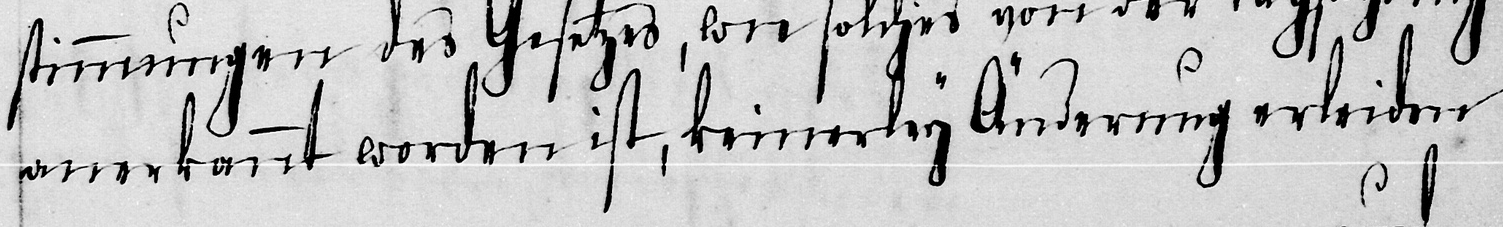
anerkannt worden ist, keinerley Änderung erleiden
